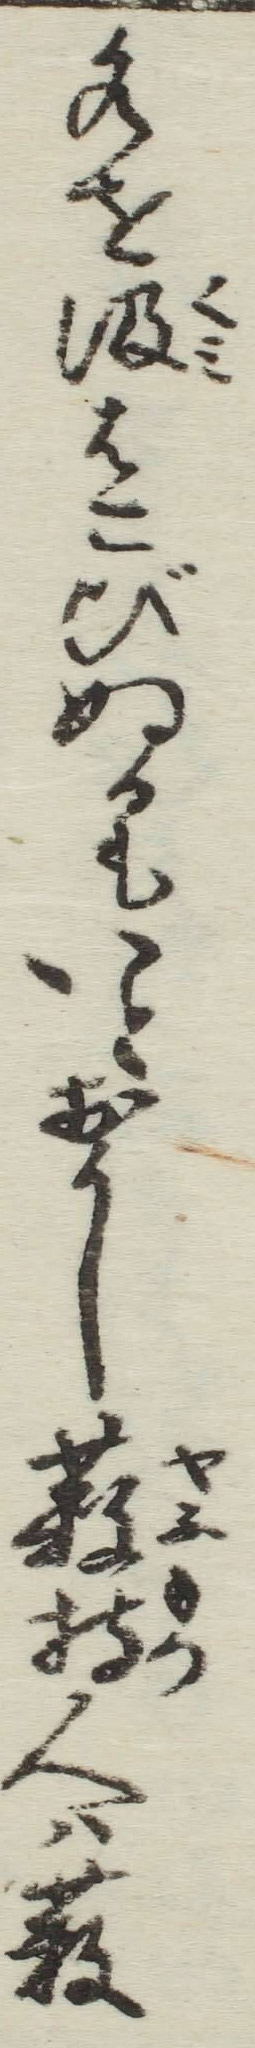水を汲はこびぬるもいとおかし藪持人は藪
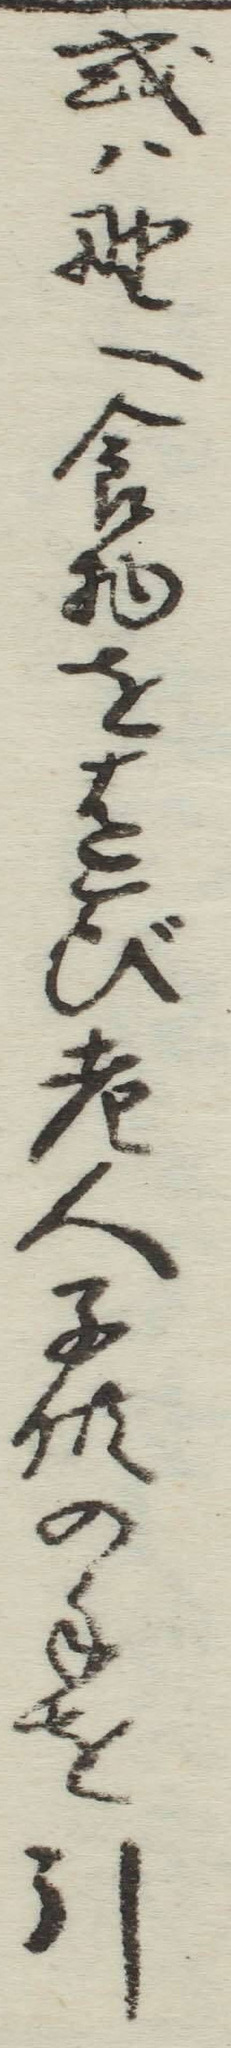或は野へ食物ををはこび老人子供の手を引
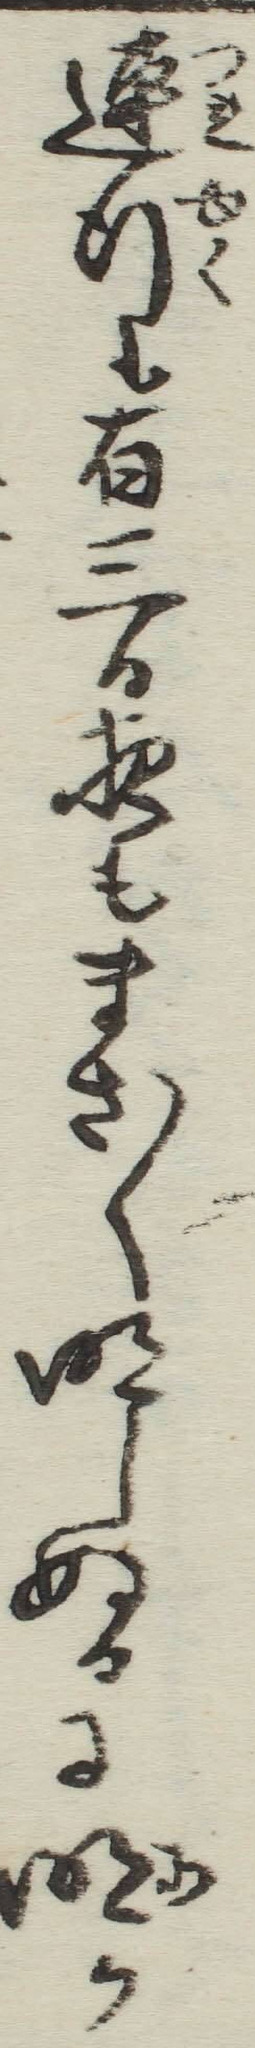連行も有三日夜もまさ〳〵明しぬるに明ケ
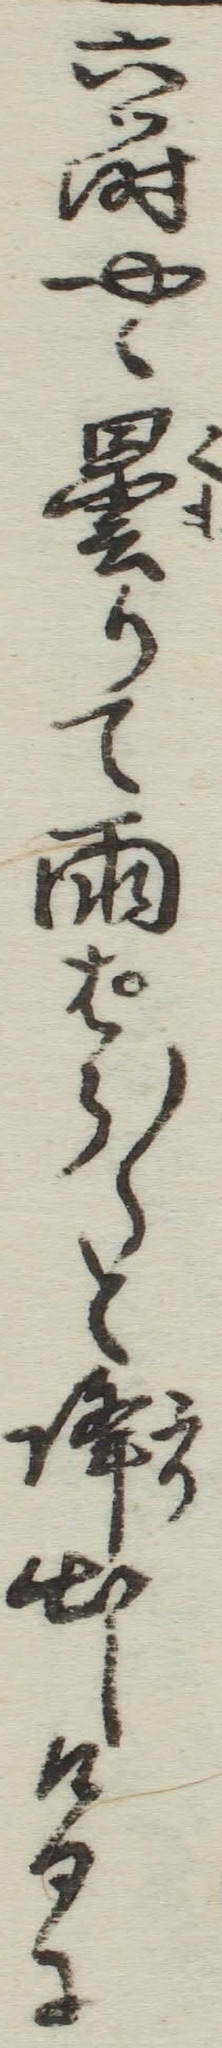六ツ時やゝ曇りて雨ぱら〳〵と降出しけるに
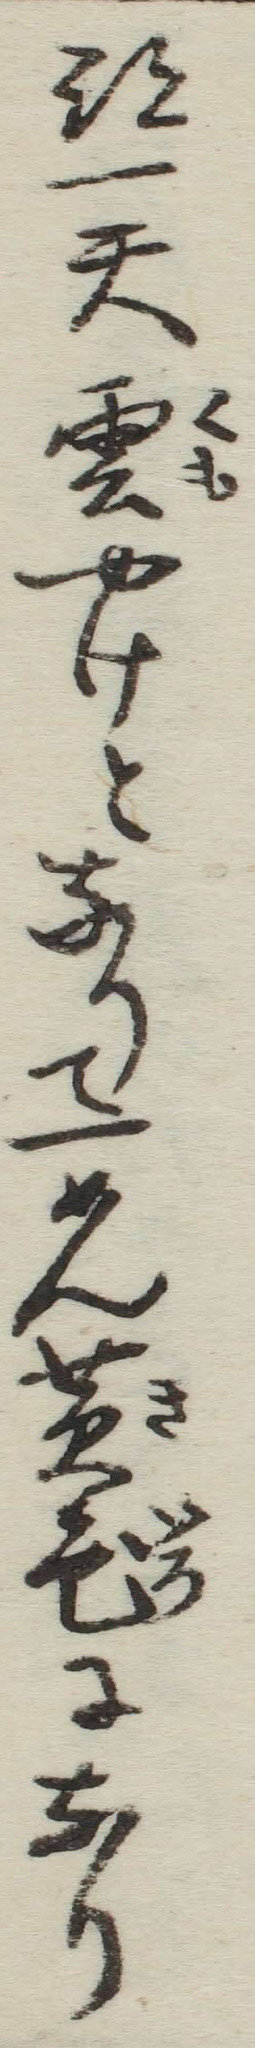跡一天雲やけとなりて一めん黄色になり
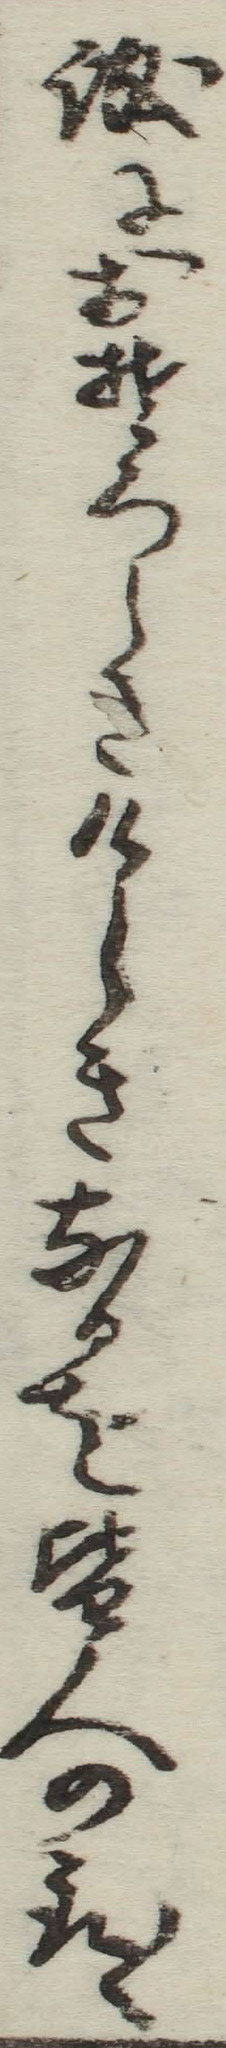誠におそろしきけしきなるを皆人の処へ

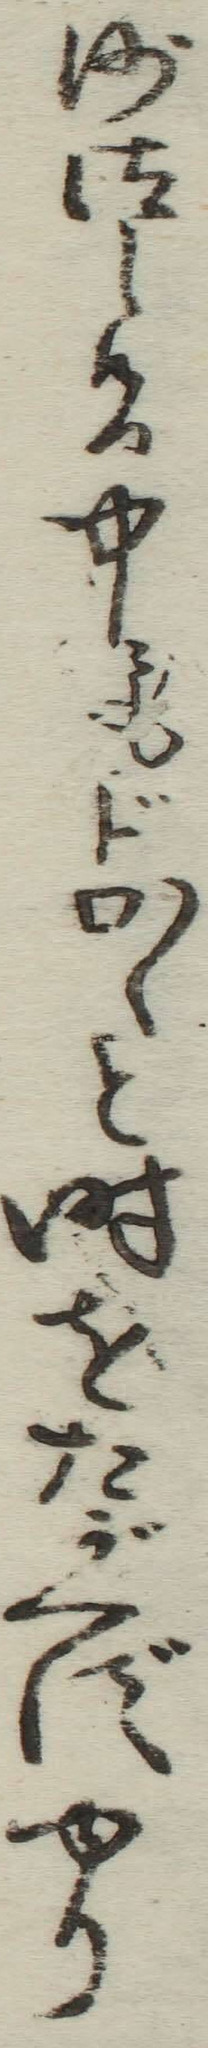沙汰しける中もドロ〳〵と時をたがへずゆり
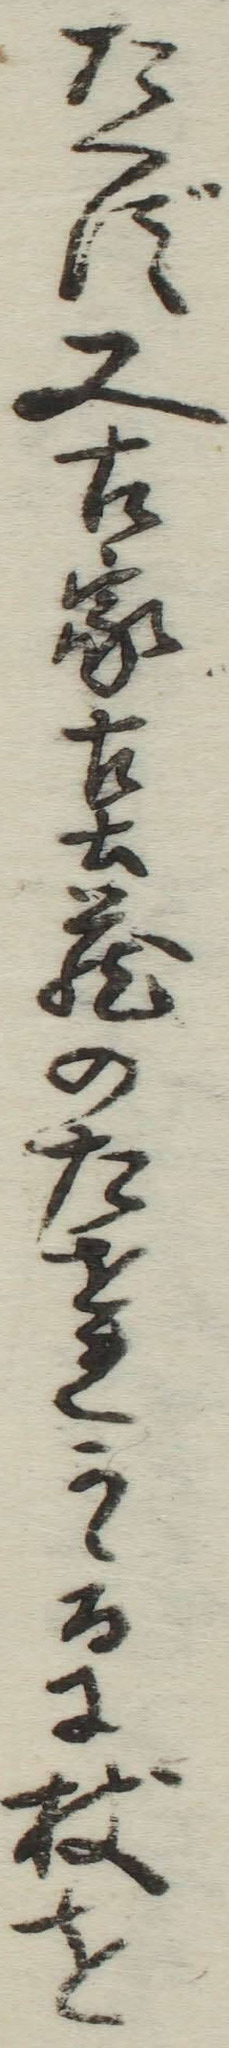たへず又古家古土蔵のたをれかゝるに杖を
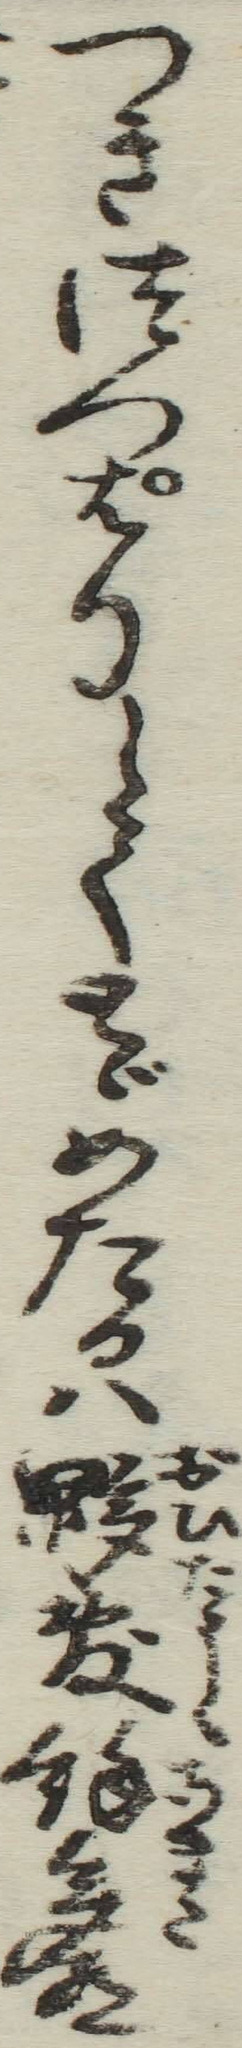つきつつぱりしてとゞめたるは夥敷餘多有
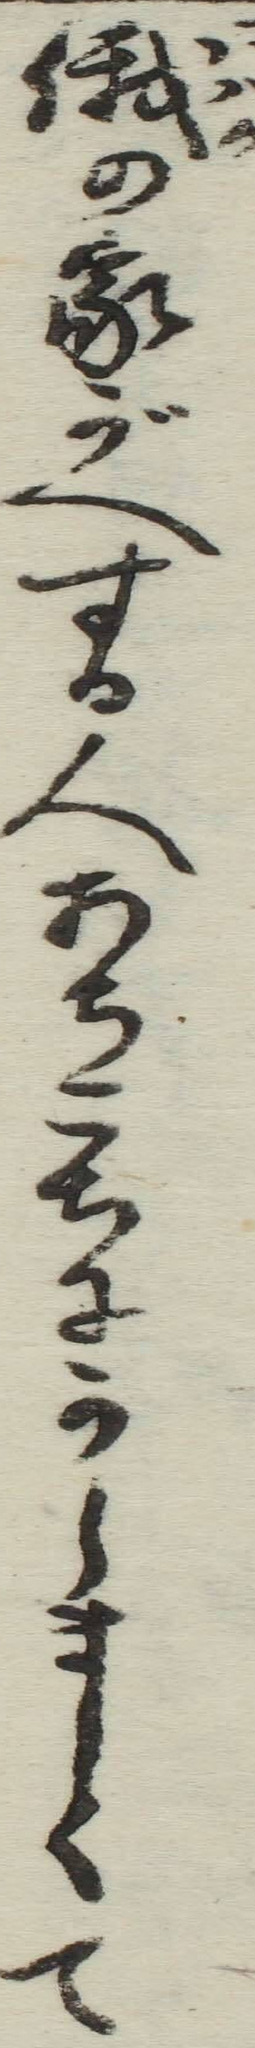俄の家がへする人あちこちにかしましくて
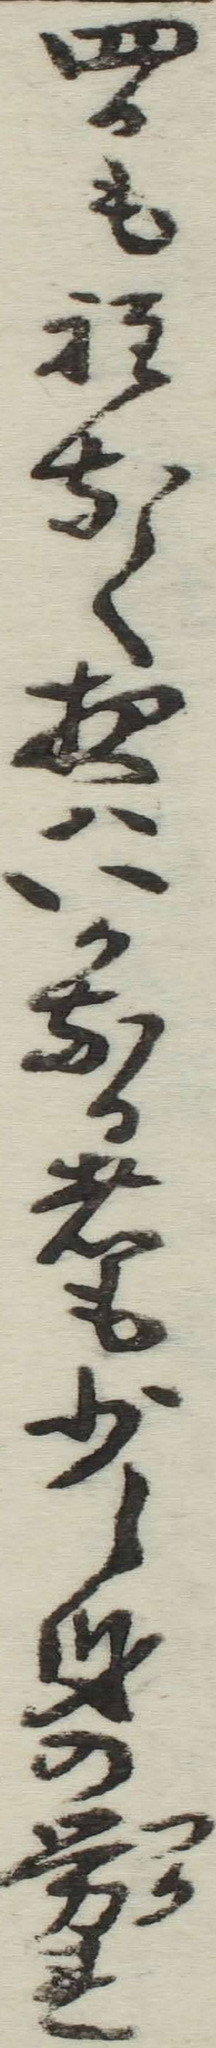四日も程なく夜はいかなる者も少し身の労れ
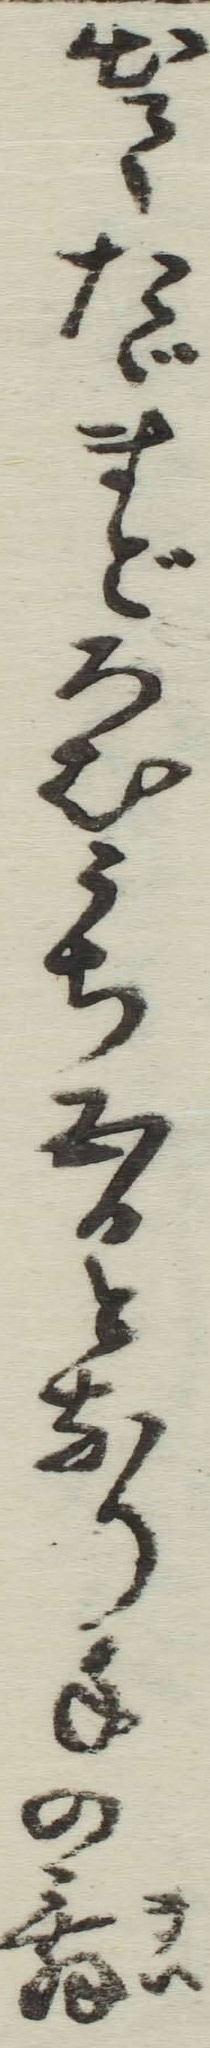出てたゞまどろむうち五日となり手の舞
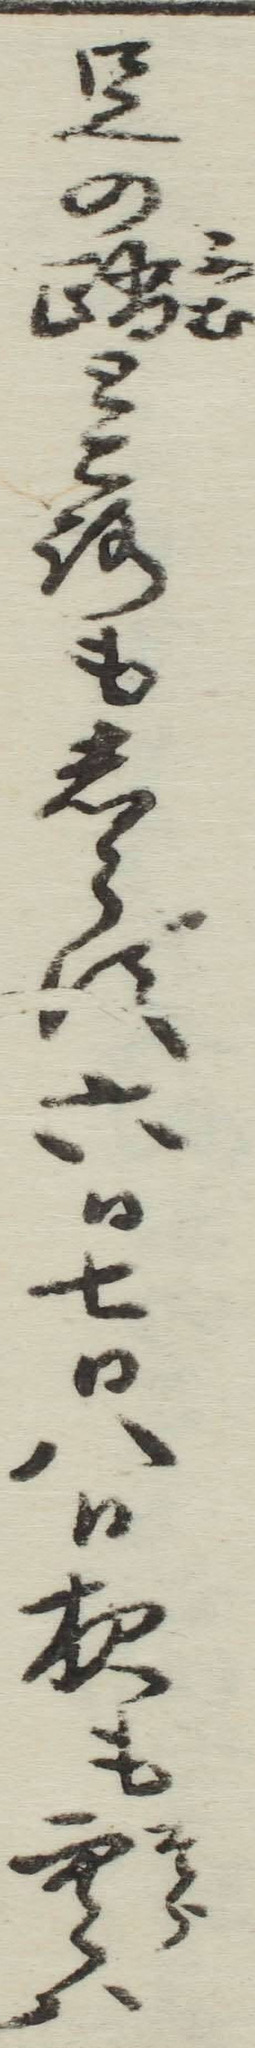足の踏ところもしらず六日七日八日夜も空は
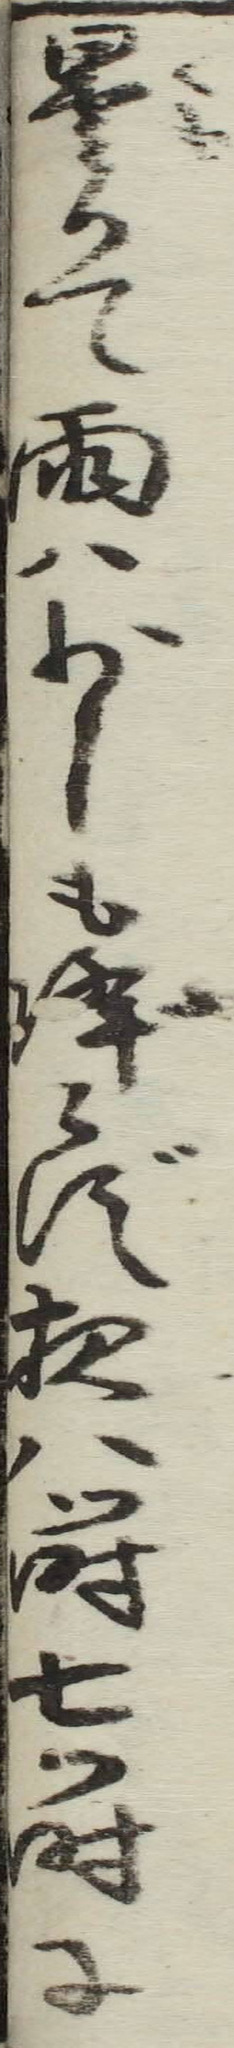曇りて雨は少しも降らず夜八ツ時七ツ時に
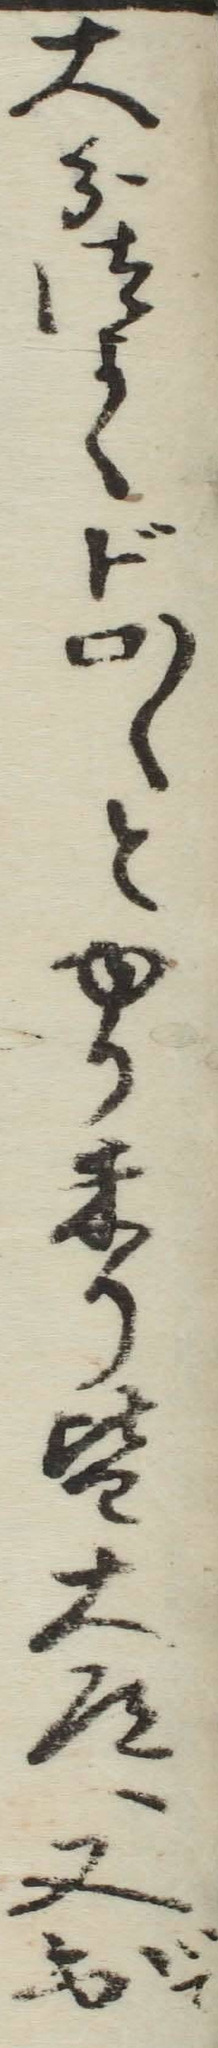大分つよくドロ〳〵とゆり来り皆大道へ又出
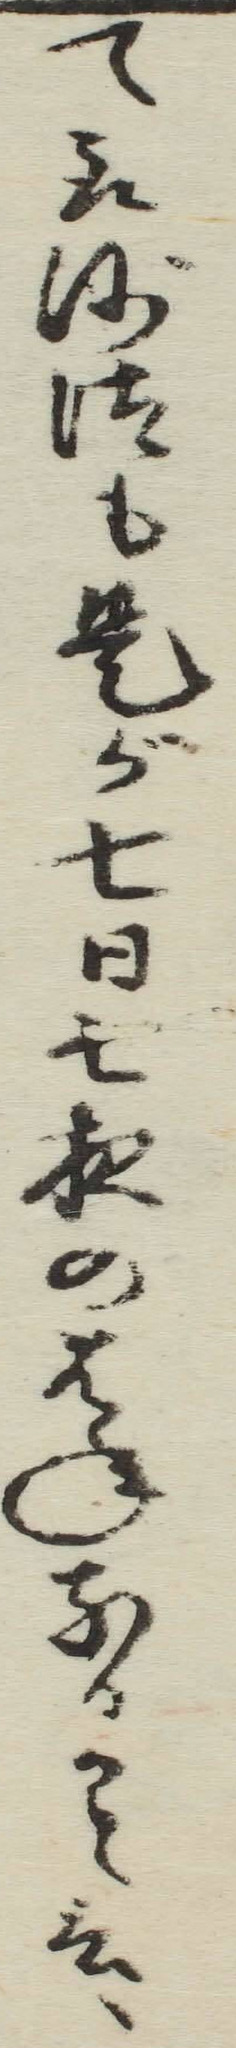て取沙汰も是が七日七夜のはねなるかと云々
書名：地震奇談／平安万歳楽
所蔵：国文学研究資料館
